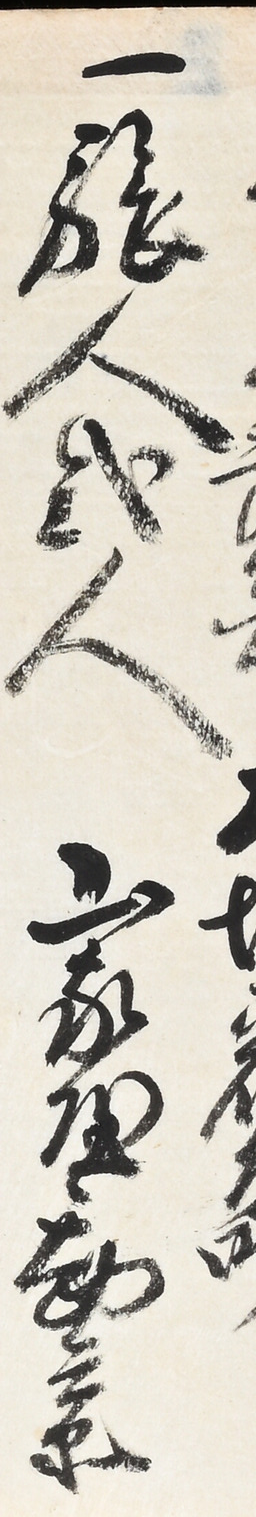一旅人弐人山家屋勘兵衛
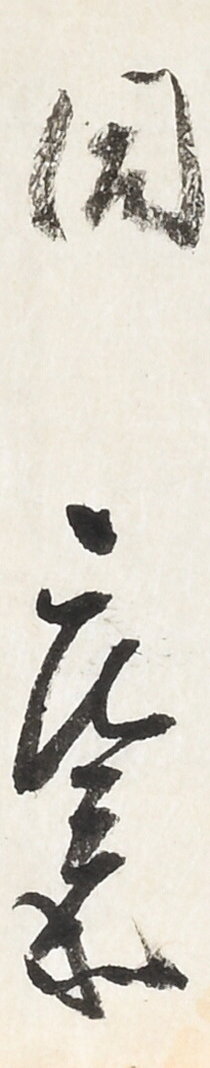同庄兵衛
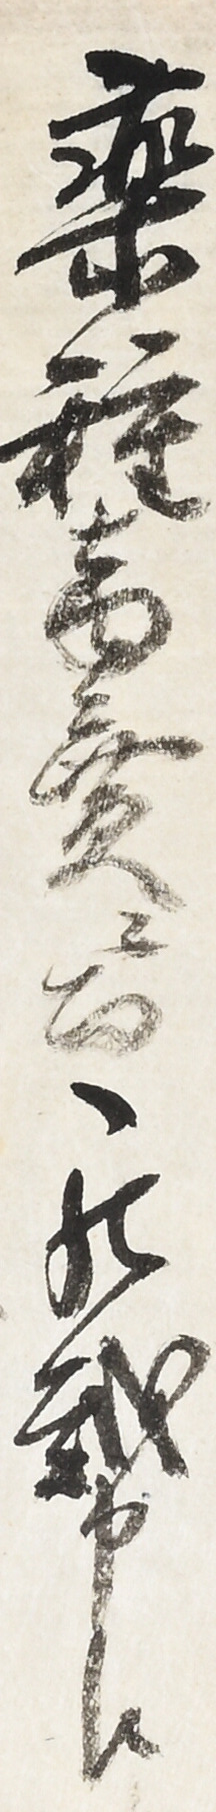薬種商売ニ而罷越申候
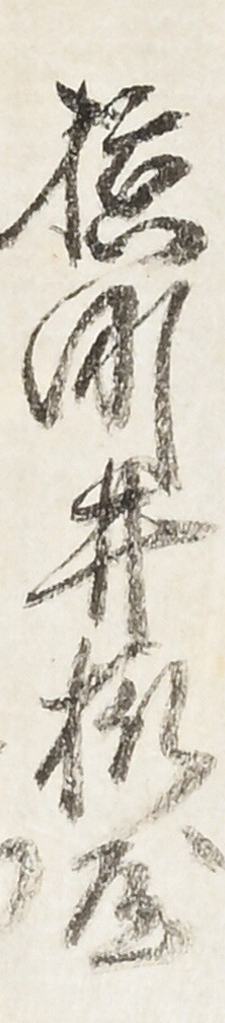横町井桁屋
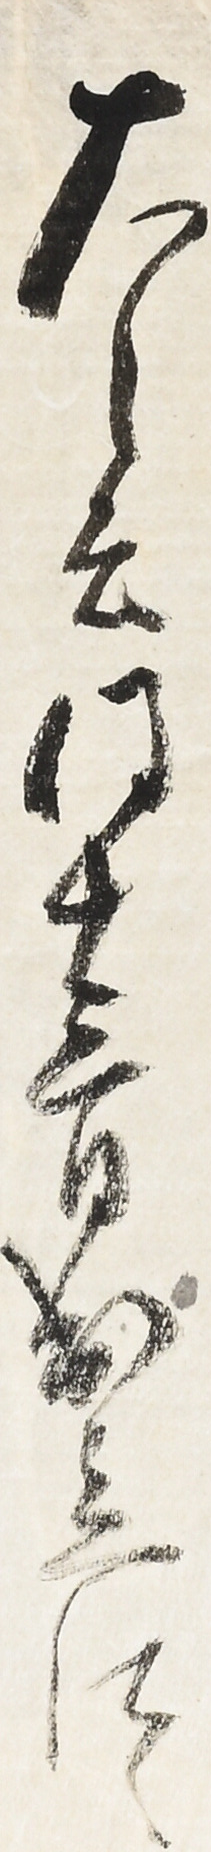右之者同十三日出立仕候
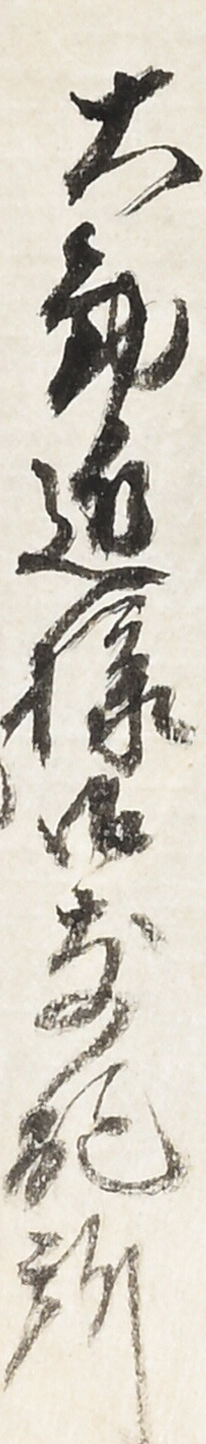大勧進様御支配所
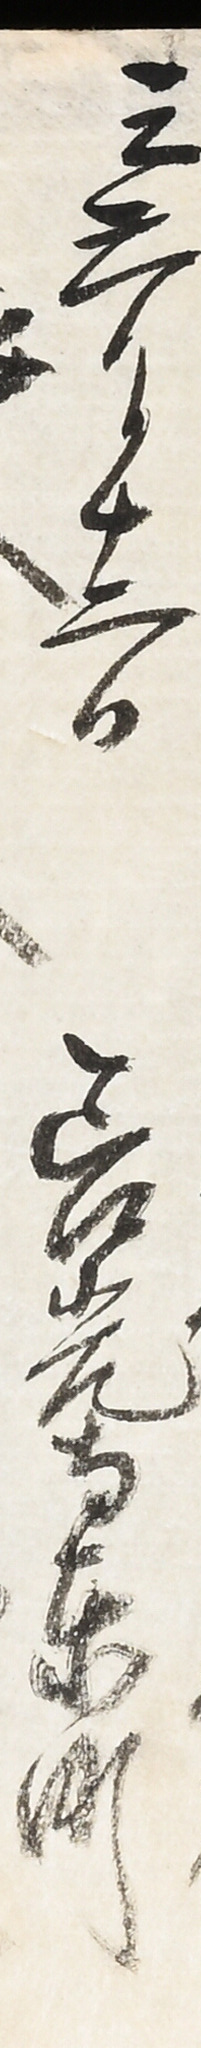壬六月十二日善光寺東町
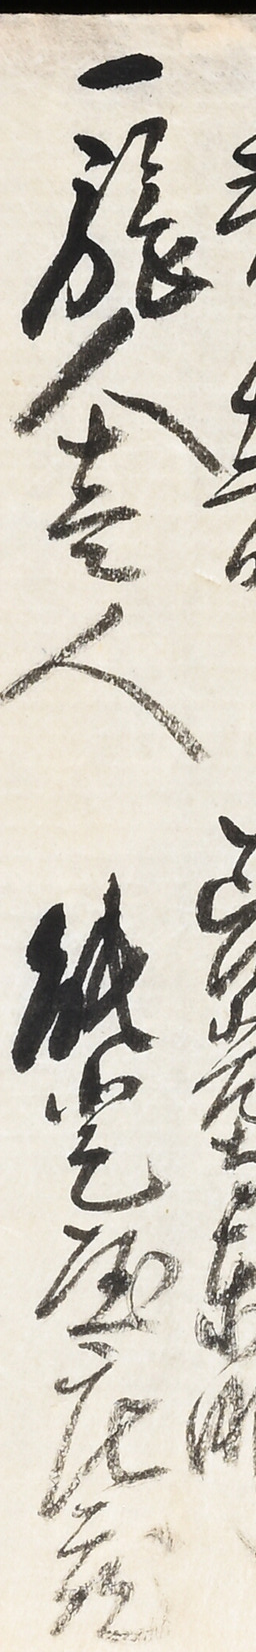一旅人壱人能登屋庄蔵
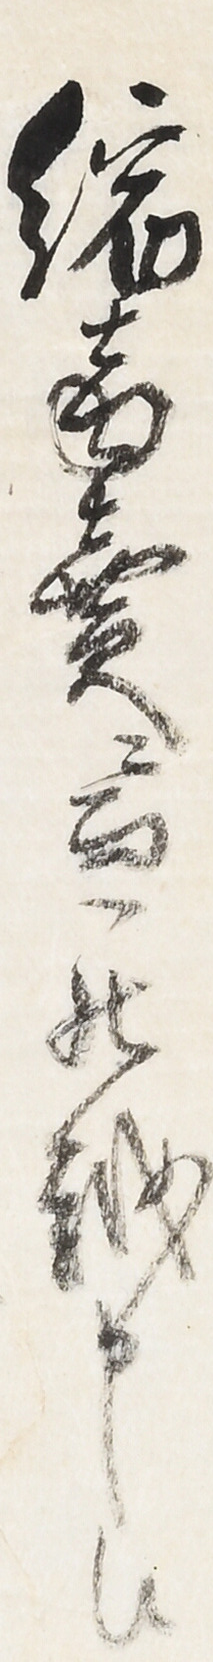縮商売ニ而罷越申候
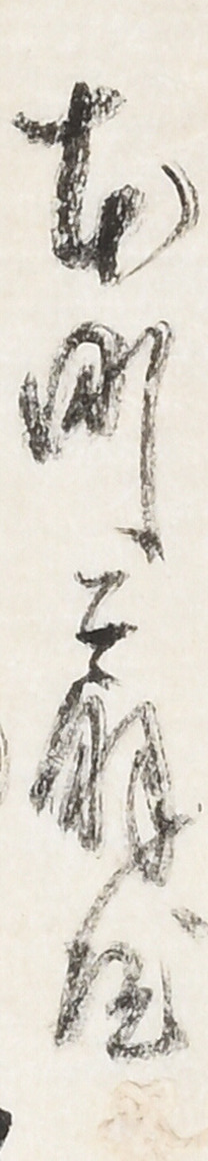本町扇屋
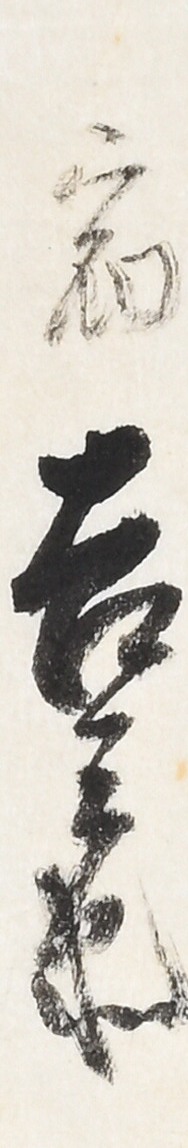宿吉兵衛
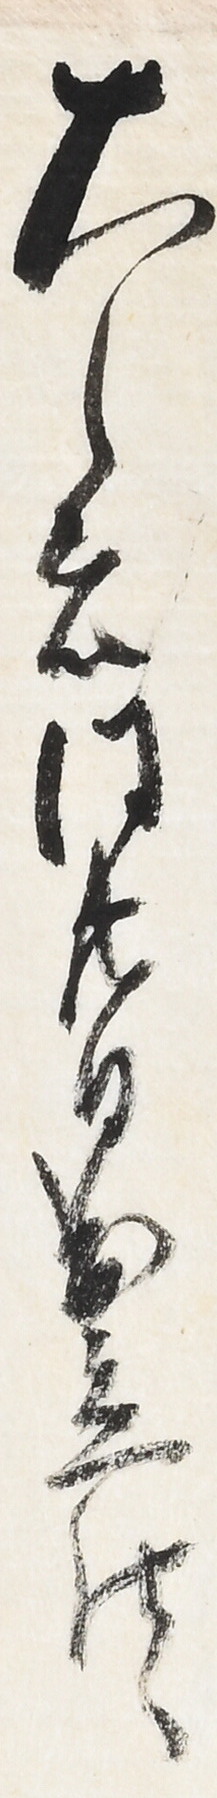右之者同廿日出立仕候
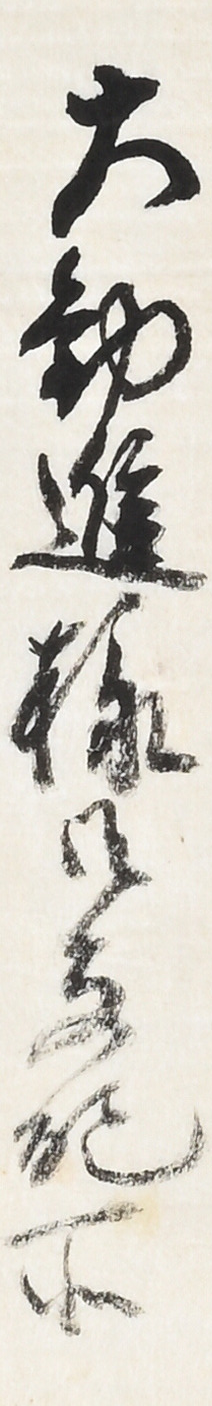大勧進様御支配所
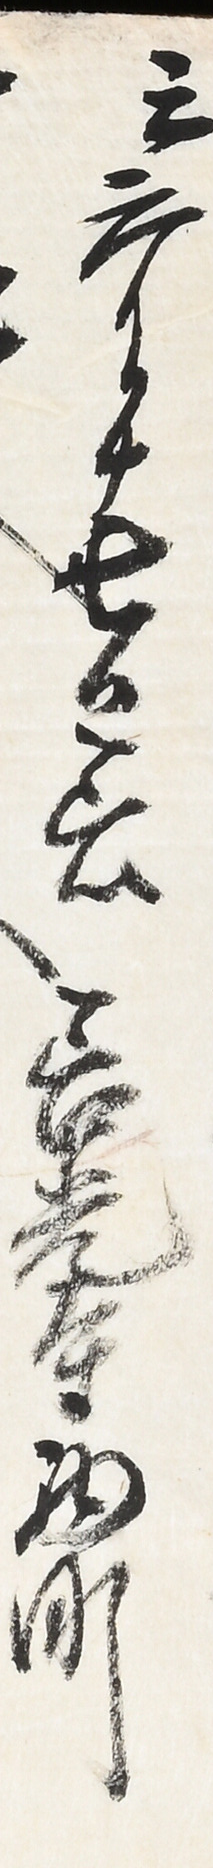壬六月十七日着善光寺西町
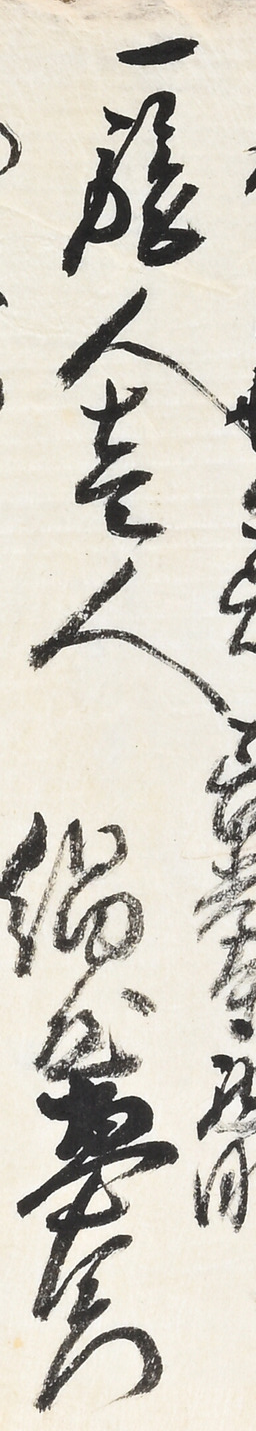一旅人壱人綿屋惣右衛門
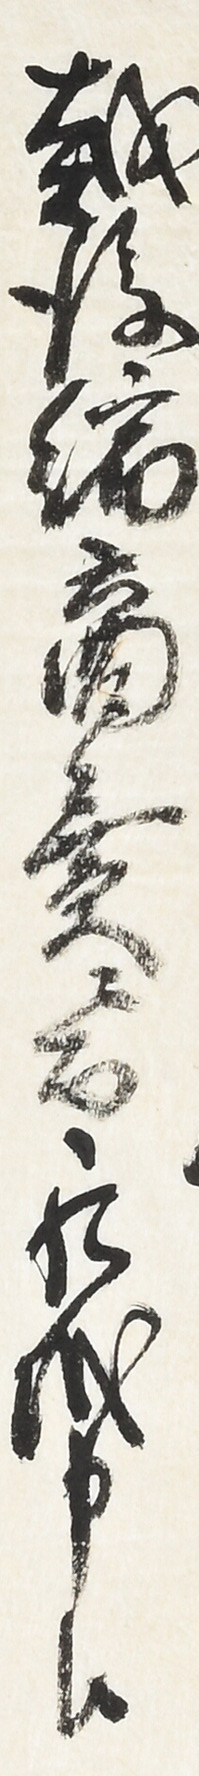越後縮商売ニ而罷越申候
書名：旅人泊控帳
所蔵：伊那市立高遠町図書館・合同会社AMANE
